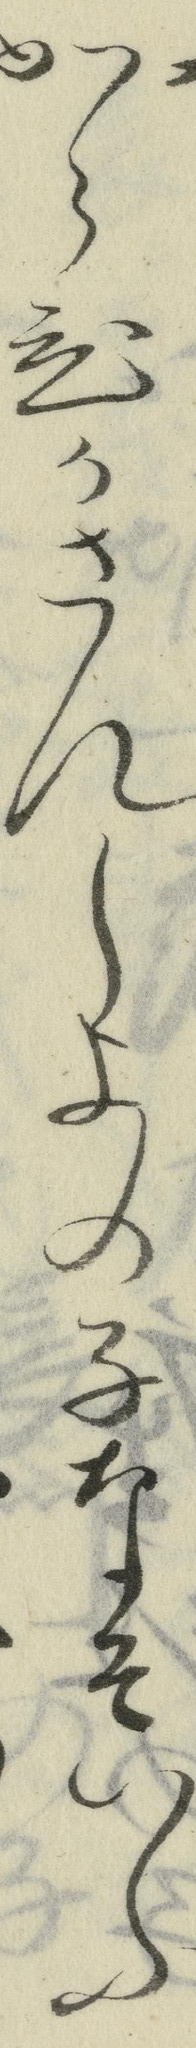からひかさんしよの子なそいふ
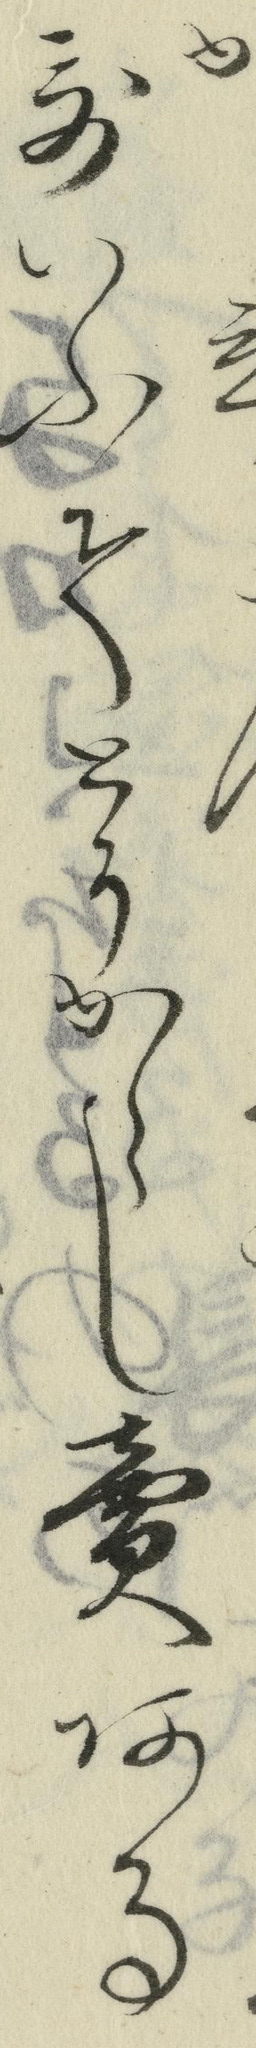寿？いふてとうからし売ある
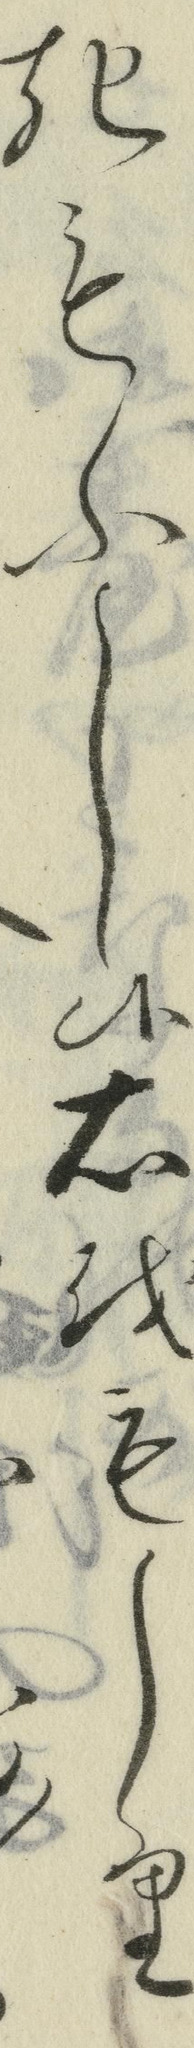起もなし候右をもしり
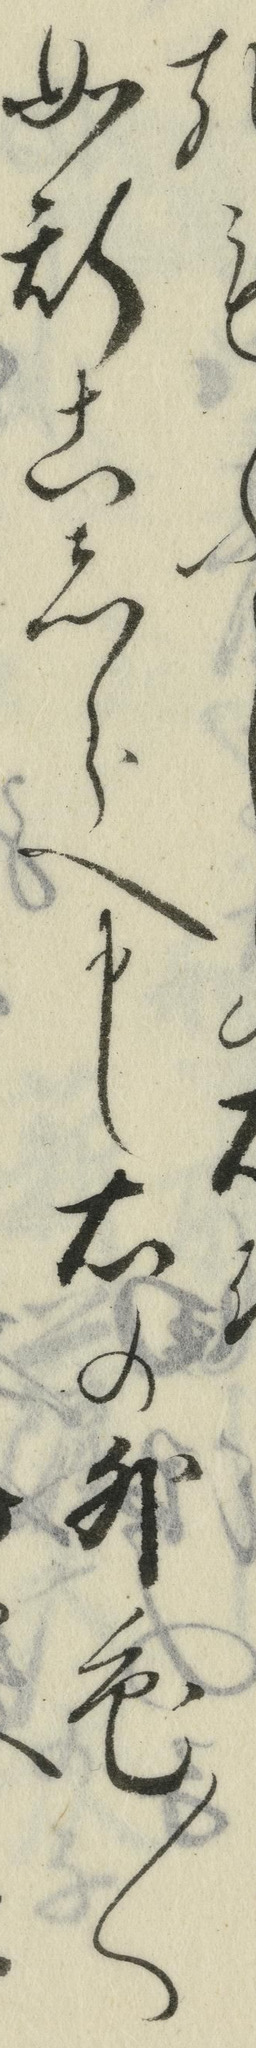如斯こしらへ申候右の外色々
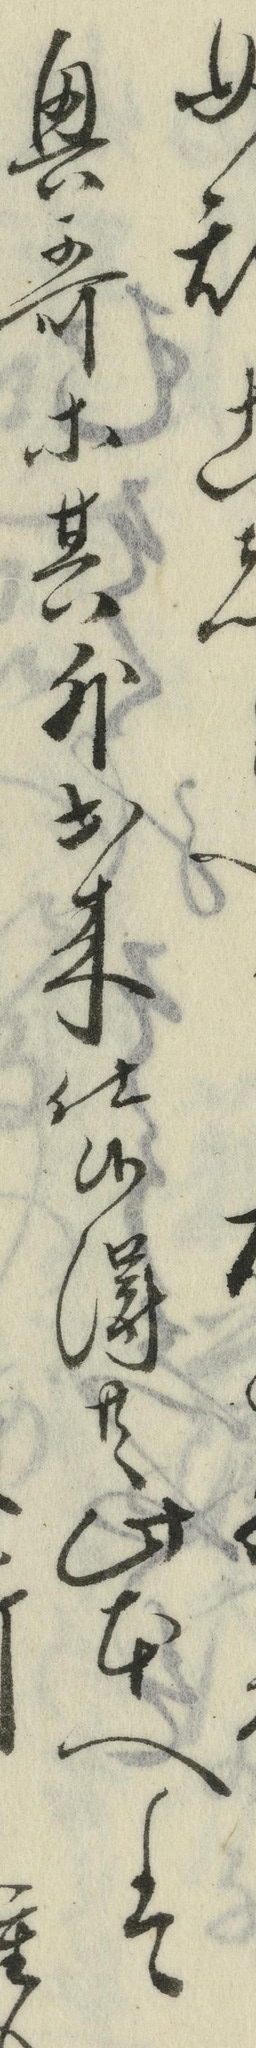奥寄等其外出来仕候得共此本へは
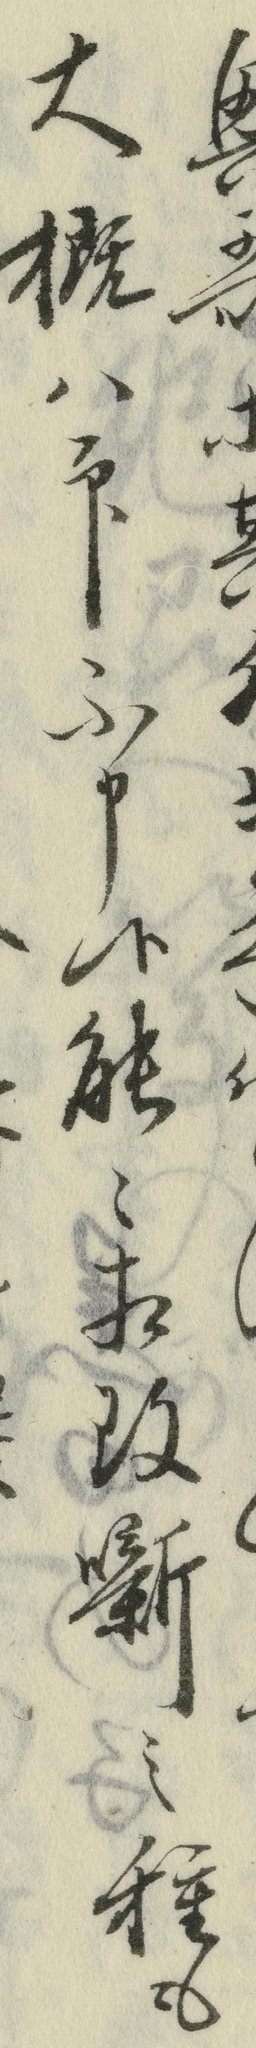大概は印不申候能々相改噺之種も
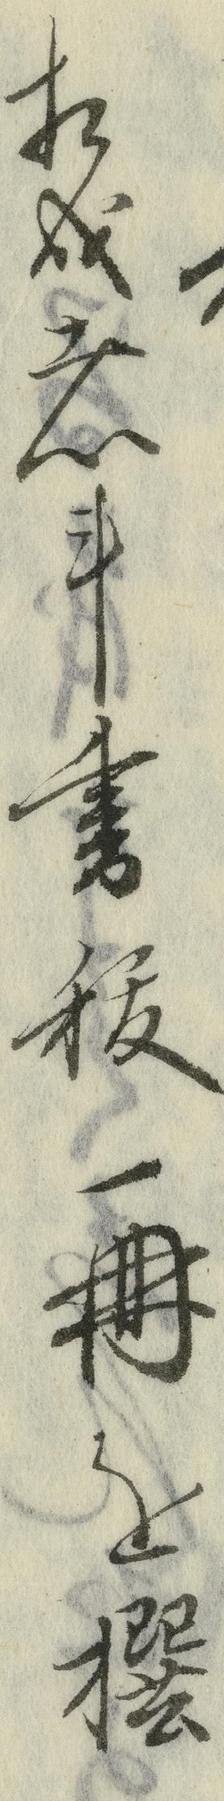相成者斗書抜一冊を撰
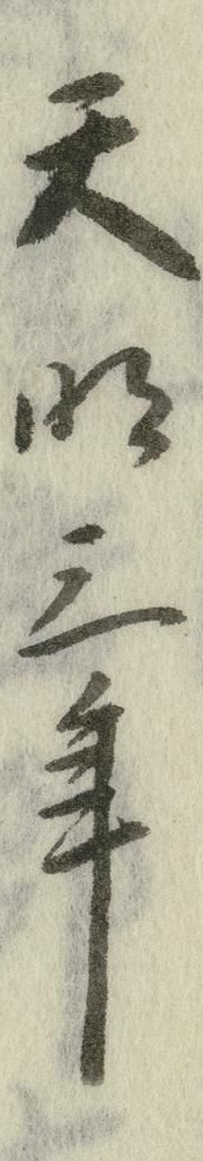天明三年
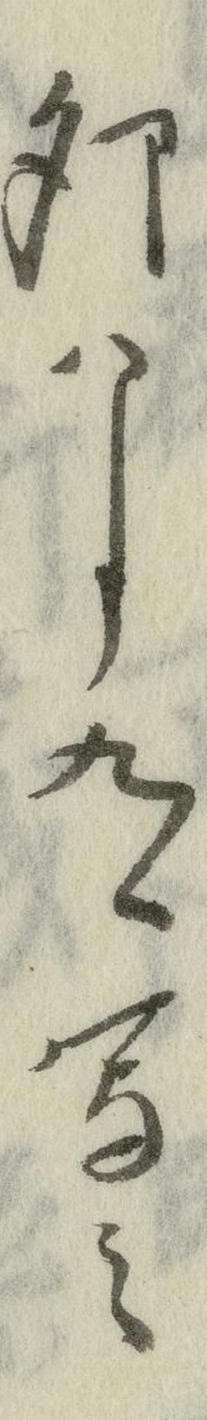卯八月九日写之
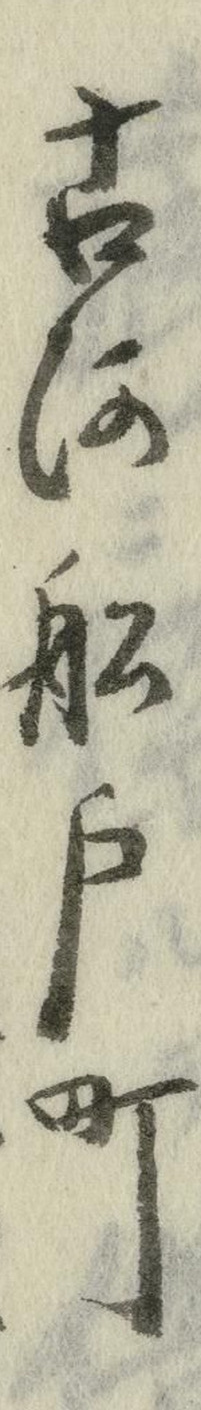古河船戸町
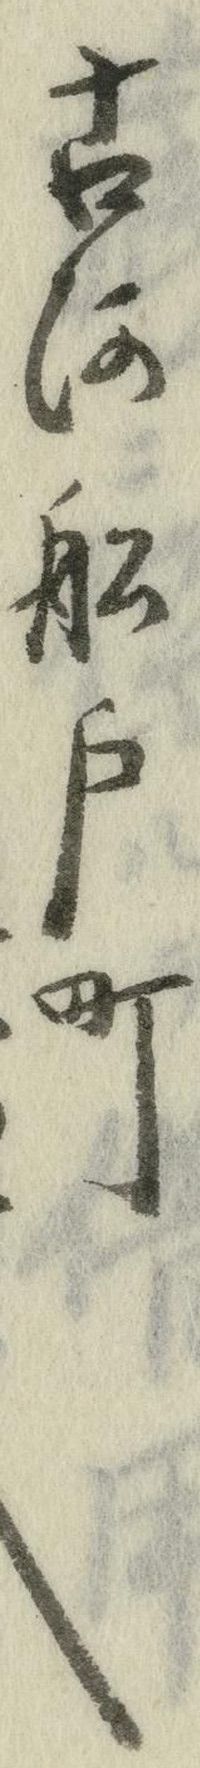古河船戸町
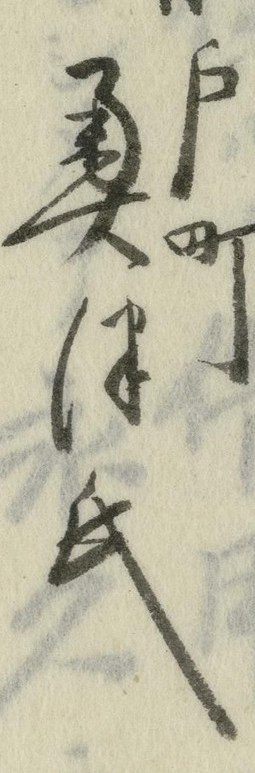奥津氏

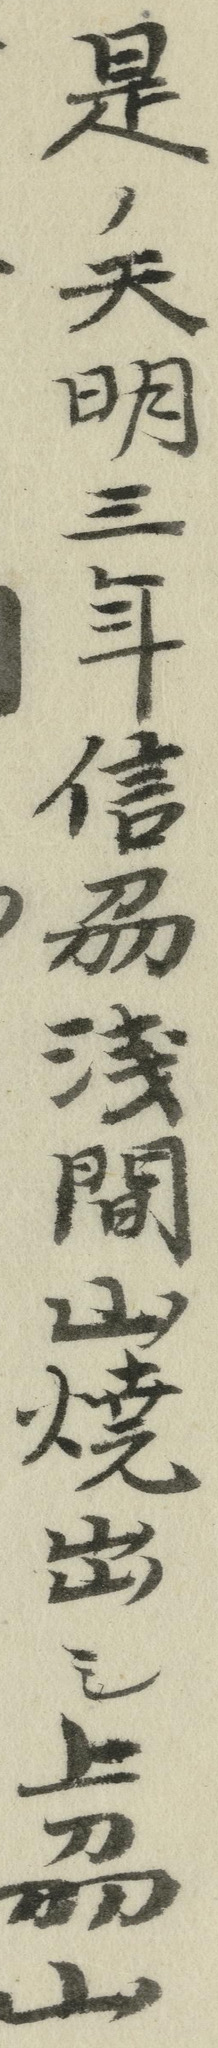是ノ天明三年信州浅間山焼出シ上州山
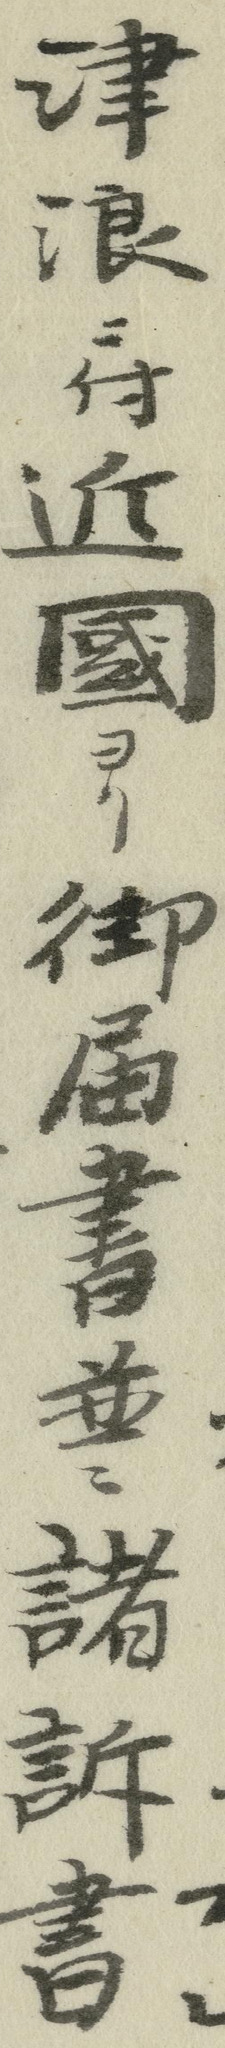津浪ニ付近国ヨリ御届書並ニ諸訴書
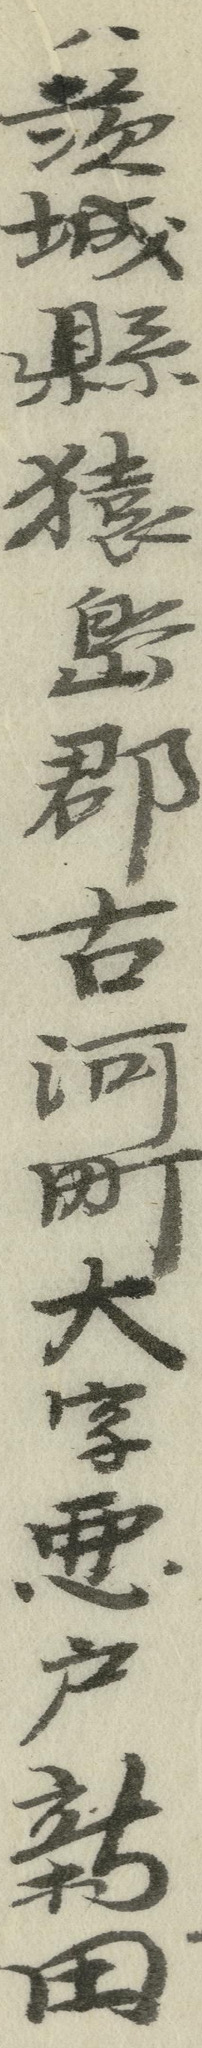ハ茨城県猿島郡古河町大字悪戸新田
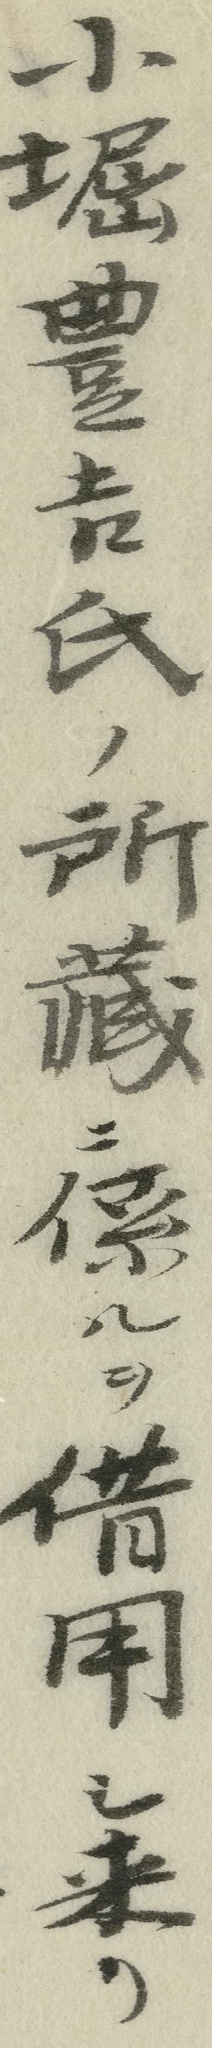小堀豊吉氏ノ所蔵ニ係ルヲ借用シ来リ
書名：天明三癸卯七月信州浅間山焼出シ上州山津浪ニ付近國ヨリ御届書并訴書写
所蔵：東京大学地震研究所図書室 Earthquake Research Institute Library, The University of Tokyo, JAPAN
